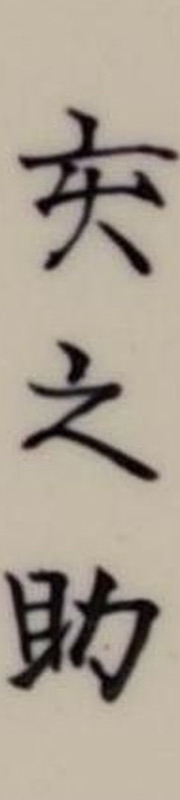亥之助
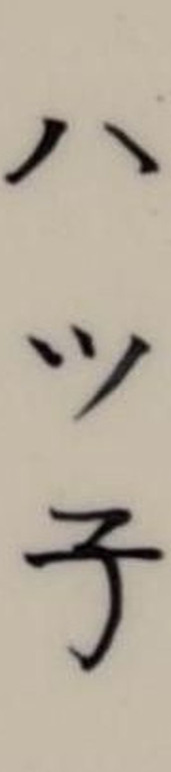ハツ子
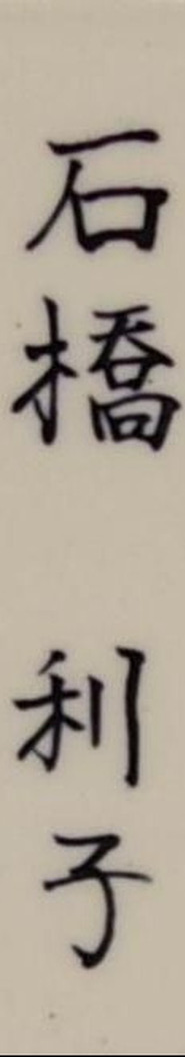石橋利子
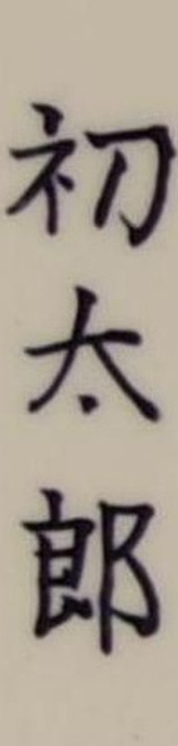初太郎

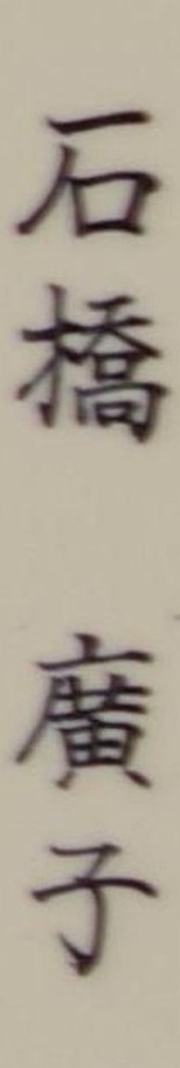石橋広子
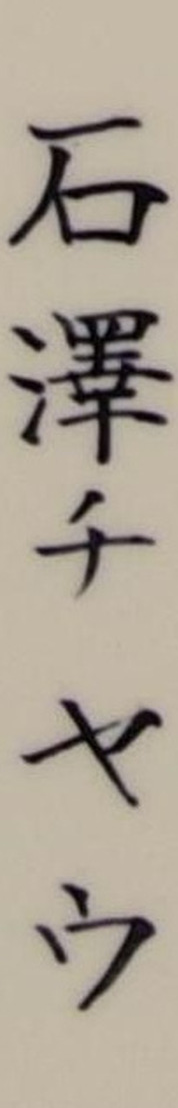石沢チヤウ
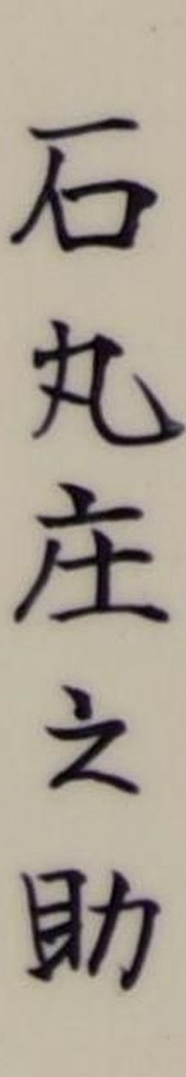石丸庄之助
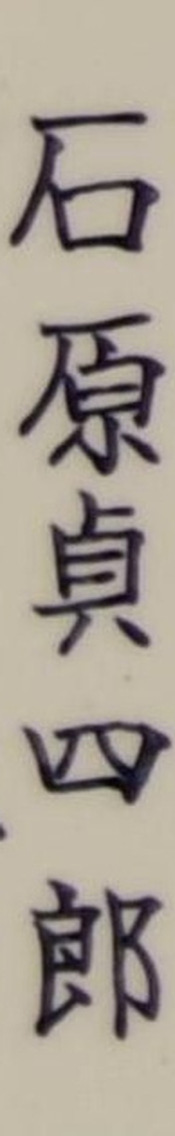石原貞四郎

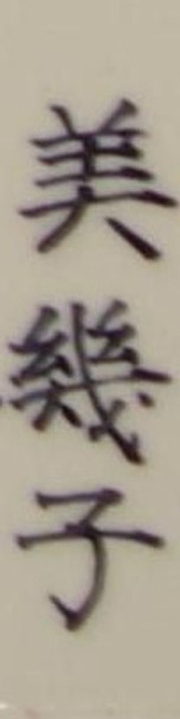美幾子
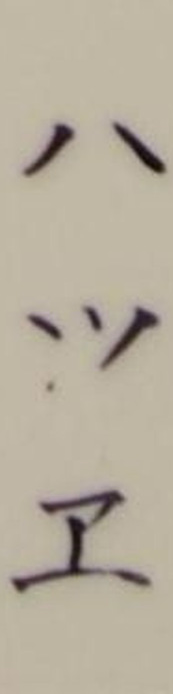ハツヱ
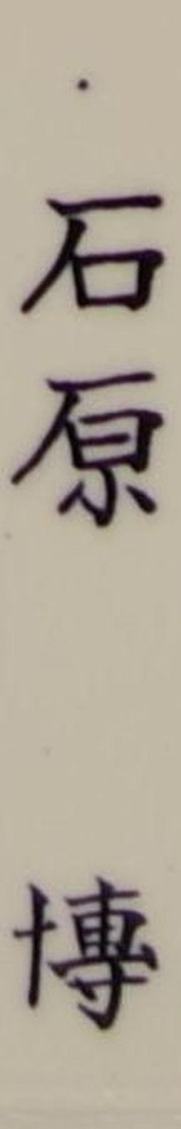石原万
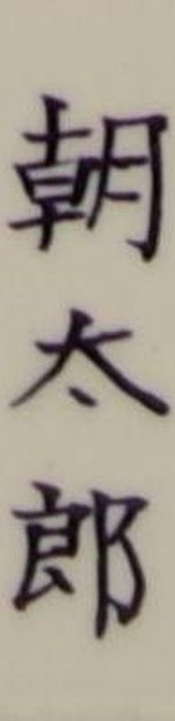朝太郎
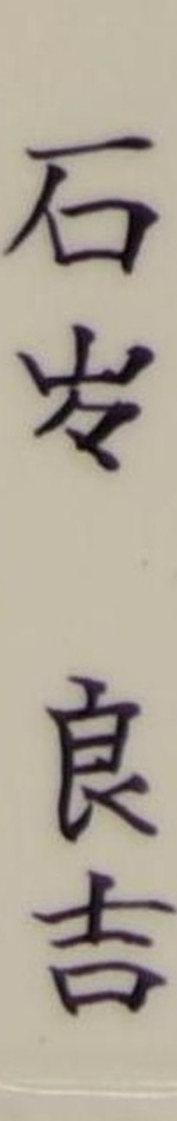石出良吉
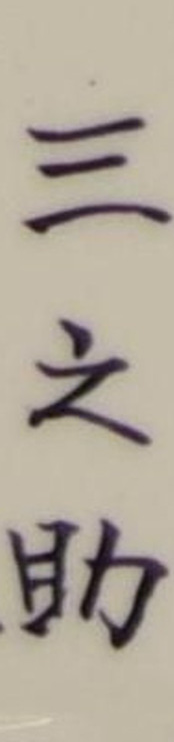三之助
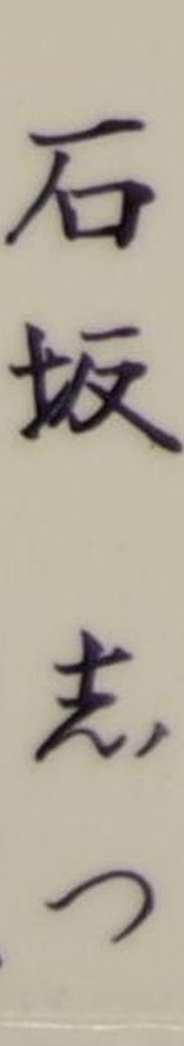石坂しつ
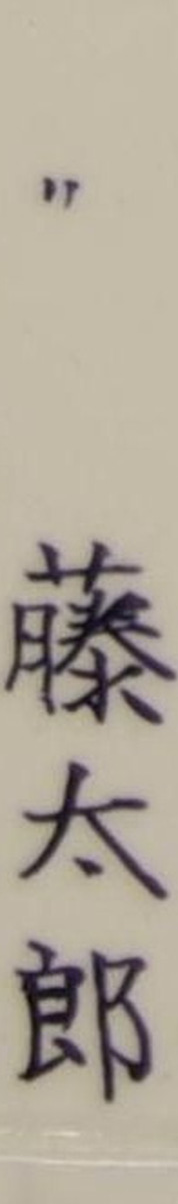藤太郎
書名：M~S
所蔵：高野山金剛峯寺
